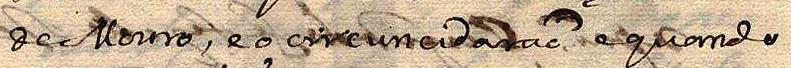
de Mouro, e o circuncidaraõ e quando
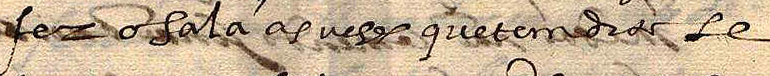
fez o salā as ueses que tem dito se
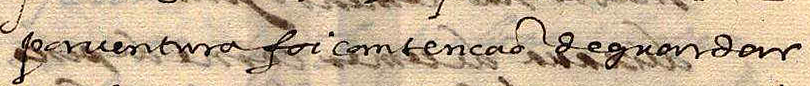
por uentura foi com tençaõ de guardar
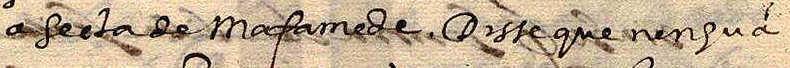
a secta de Mafamede. Disse que nunquā
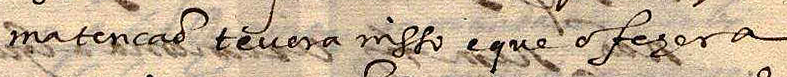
ma tençaõ teuera nisso e que o fezera
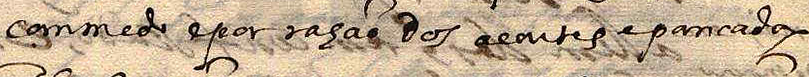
com medo e por razaõ dos açoutes e pancadas
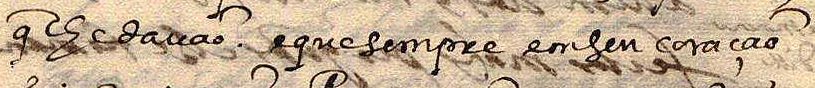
q̄ lhe dauão. e que sempre em seu coraçaõ
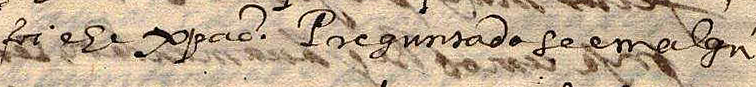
foi e he xpaõ. Preguntado se em algū
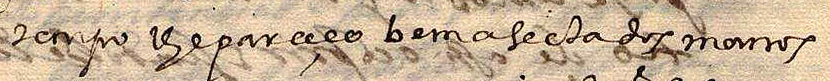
tempo lhe pareceo bem a secta dos mouros
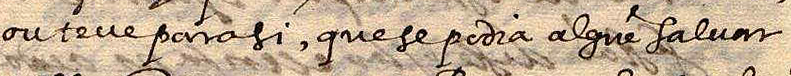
ou teue para si, que se podia alguē saluar
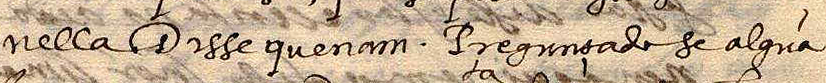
nella. Disse que nam. Preguntado se alguā
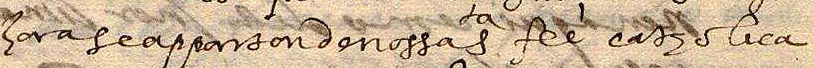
hora se appartou de nossa sta feé catholica
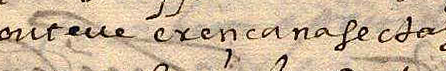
ou teue crença na secta
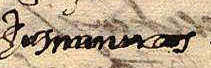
_ mouros
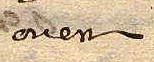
ou em
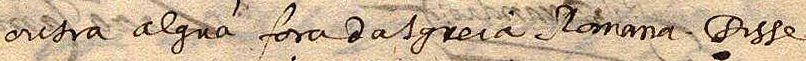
outra alguā fora da Igreia Romana Disse
